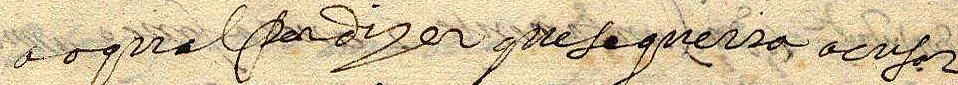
ao qual por dizer que se queira acusar
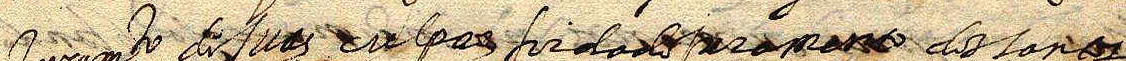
de suas culpas foi dado juramento dos santos
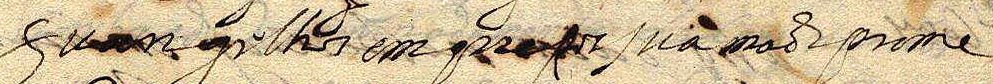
Euangelhos em que pos sua maõ prome
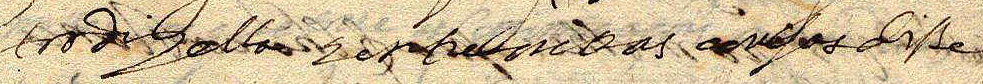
teo dizella E entre outras cousas disse
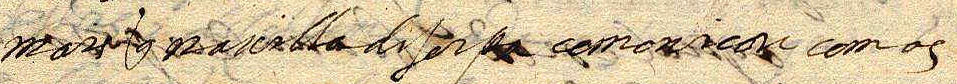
mais q̄ na uilla de serpa comonicou com as
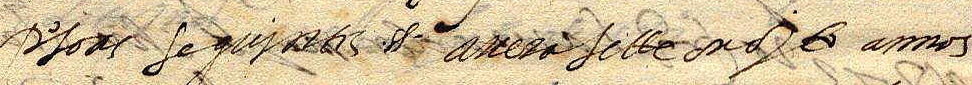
pesoas seguintes .ss. auera sette ou ojto annos
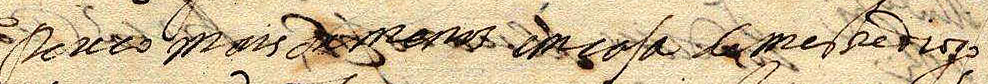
pouco mais ou menos em casa de mestre diogo
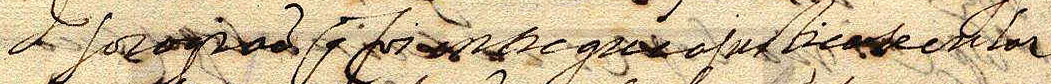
sorojiaõ q̄ foi entregue a justiça secular
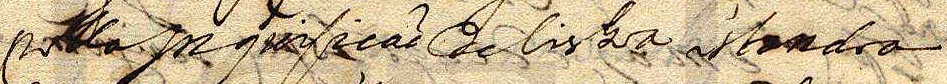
polla jnquisiçaõ de lisboa estando a
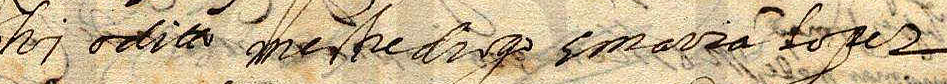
hj o ditto mestre diogo E maria lopez
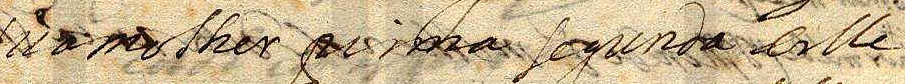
sua molher prima segunda delle
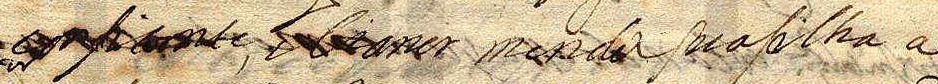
confitente, E lianor mendez sua filha a
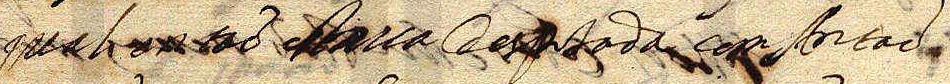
qual entaõ estaua desposada com Antaõ
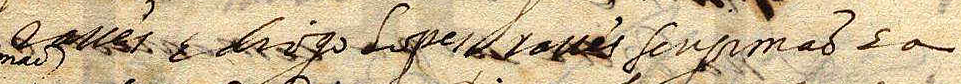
rauēs E diogo lopes rauēs seu jrmaõ E a
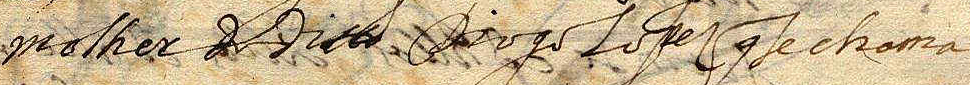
molher do ditto Diogo Lopez q̄ se chama
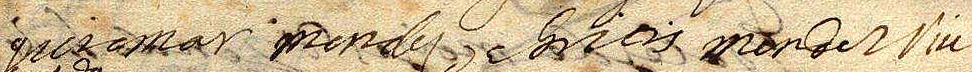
guiomar mendez, e britis mendez viu
